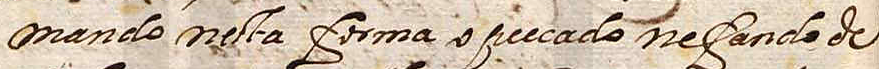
mando nesta forma o peccado nefando de
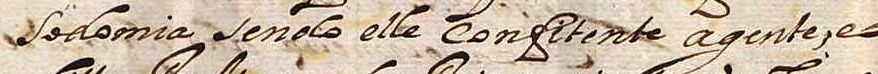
sodomia sendo elle confitente agente, e o
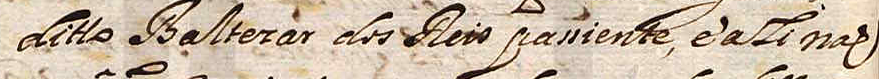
ditto Baltezar dos Reis passiente, e aLi naõ
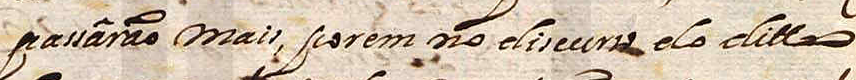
passárão mais, porem no discurso do ditto
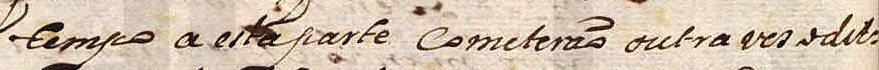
tempo a esta parte cometeraõ outra ves o dit
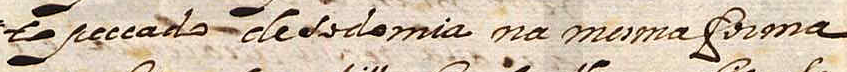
to peccado de sodomia na mesma forma
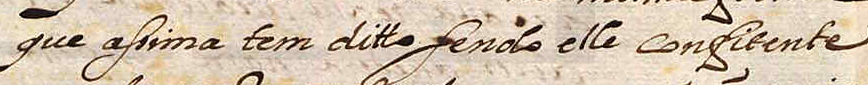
que assima tem ditto sendo elle confitente
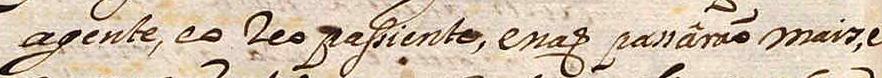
agente, e o Reo passiente, e naõ passáraõ mais, e
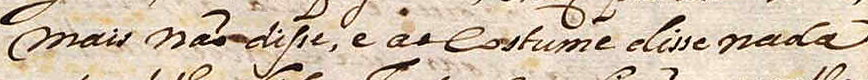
mais naõ disse, e ao costume disse nada
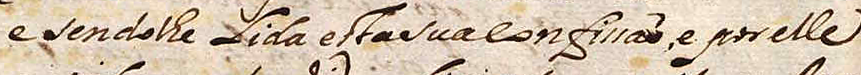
e sendolhe Lida esta sua confissaõ, e por elle
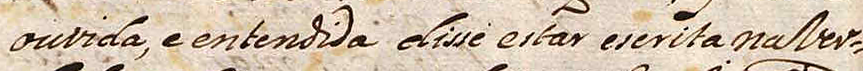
ouvida, e entendida disse estar escrita na Ver
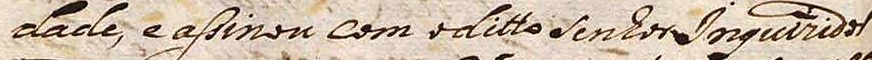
dade, e assinou com o ditto senhor Inquizidor
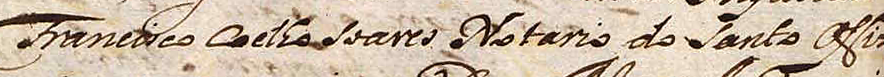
Francisco Coelho soares Notario do Santo Offi
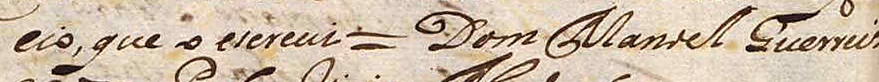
cio, que o escreui = Dom Manoel Guerrei
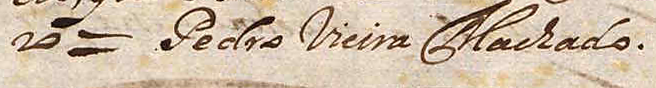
ro = Pedro Vieira Machado.
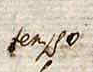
tempo
